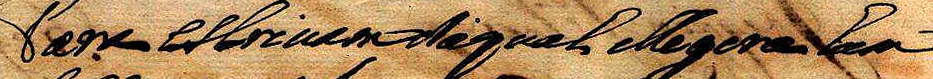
Para esCriuam da quaL ellegera hum
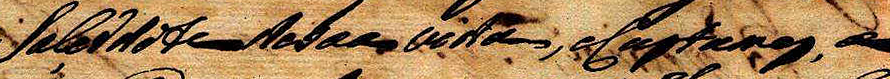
SaÇerdote de boa vida, e Custumes, a
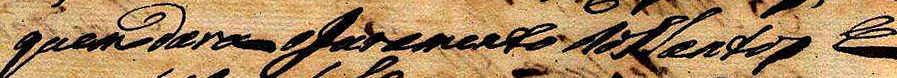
quem dara o Juramento dos santos E
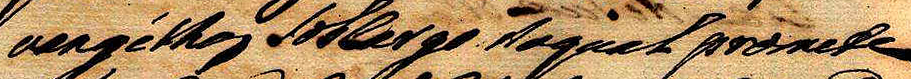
vangélhos sobCargo do quaL promete
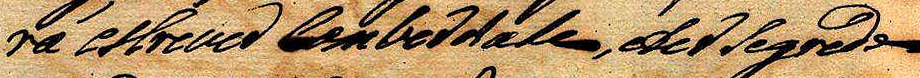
rá esCreuer Com verdade e ter segredo
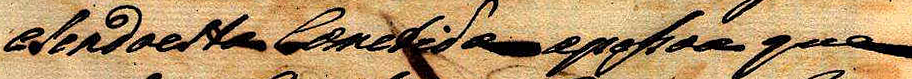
e sendo esta Cometida a pessoa que
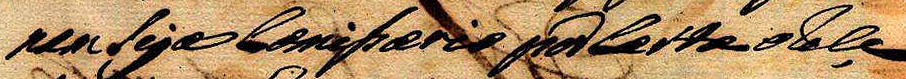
nam seja Comissario por Certa o ReÇe
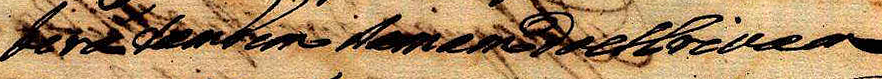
berá tambem da mam do esCrivam
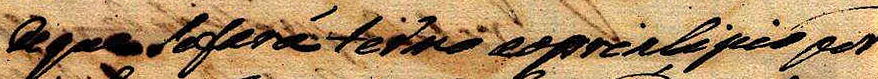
de que se fará termo ao prinÇipio per
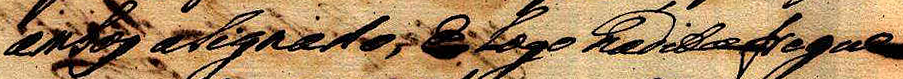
ambos asignado, E Logo na dita fregue
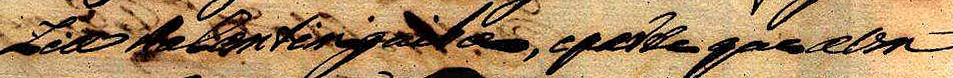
Zia da Contimguiba, e parte que a vm
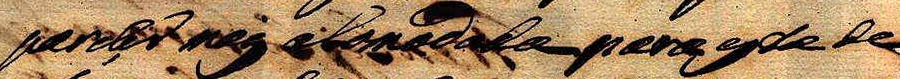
pareÇer mais aComodada para esta de
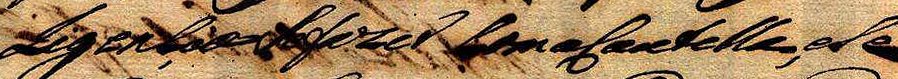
LigenÇia se fazer Com Cautella, e Se
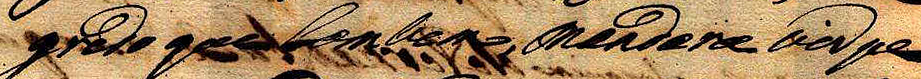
gredo que Comvem, Mandara vir pe
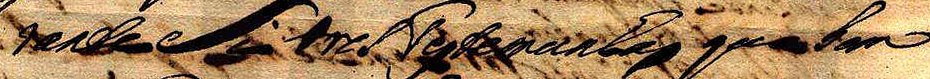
rante Si tres Testemunhas que bem
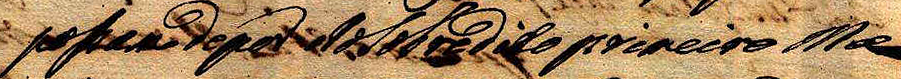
possam depor do sobredito primeiro Ma
